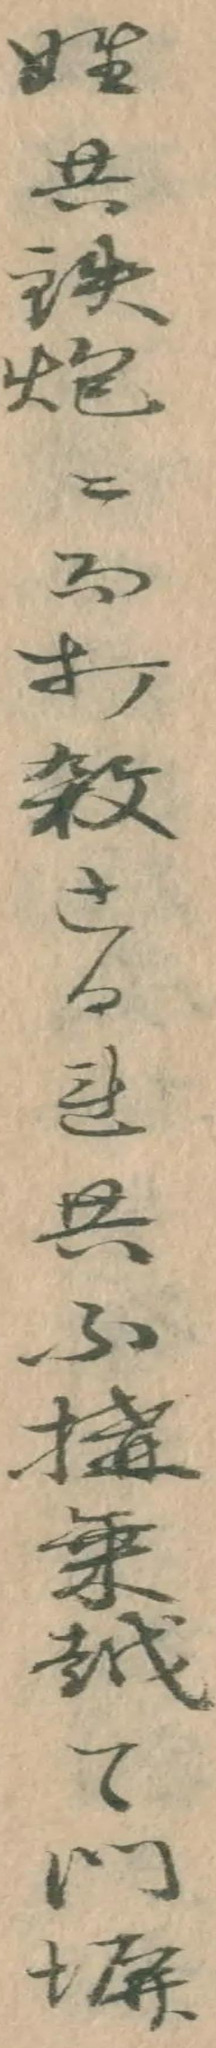姓共鉄炮に而打殺さるれ共不構乗越て門塀
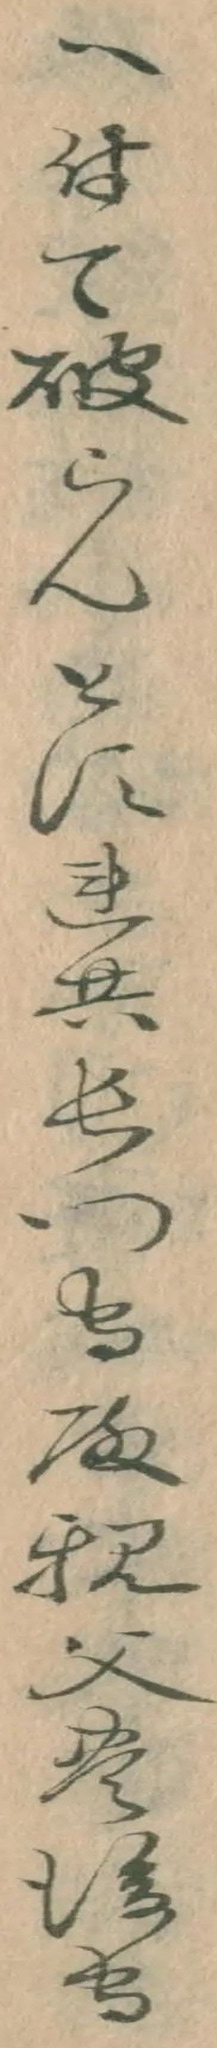へ付て破らんとすれ共長門守殿親父豊後守

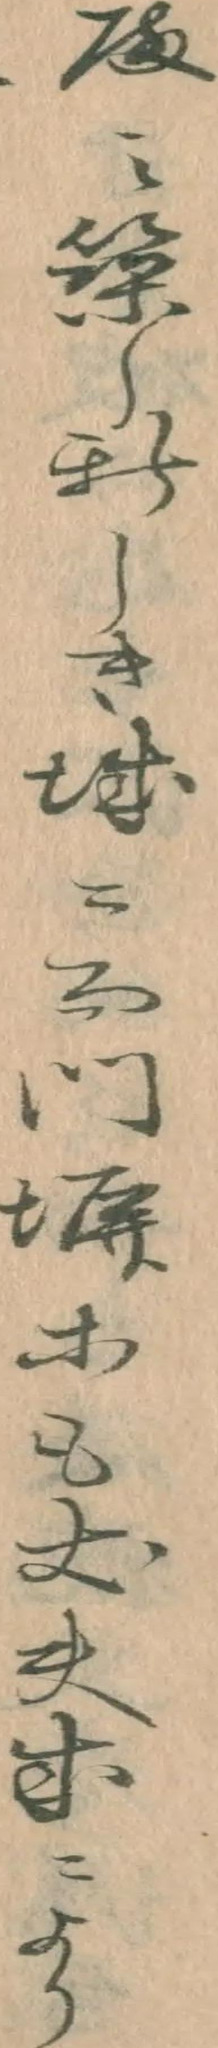殿之築し新しき城に而門塀等も丈夫成により
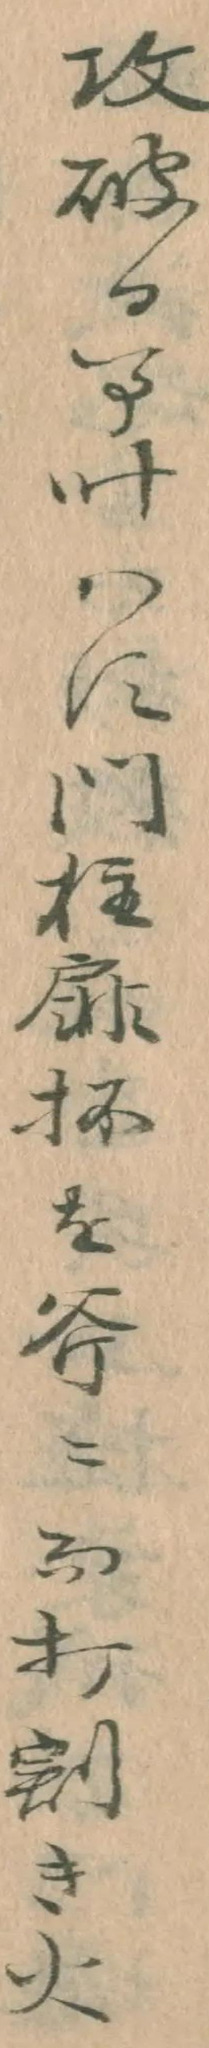攻破る事叶はす門柱扉抔を斧に而打割き火
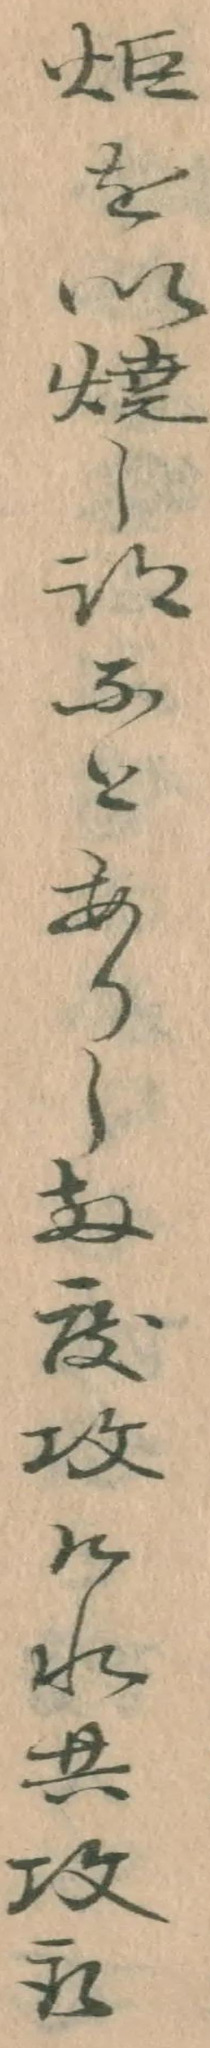炬を以焼し跡なとありし両度攻けれ共攻取
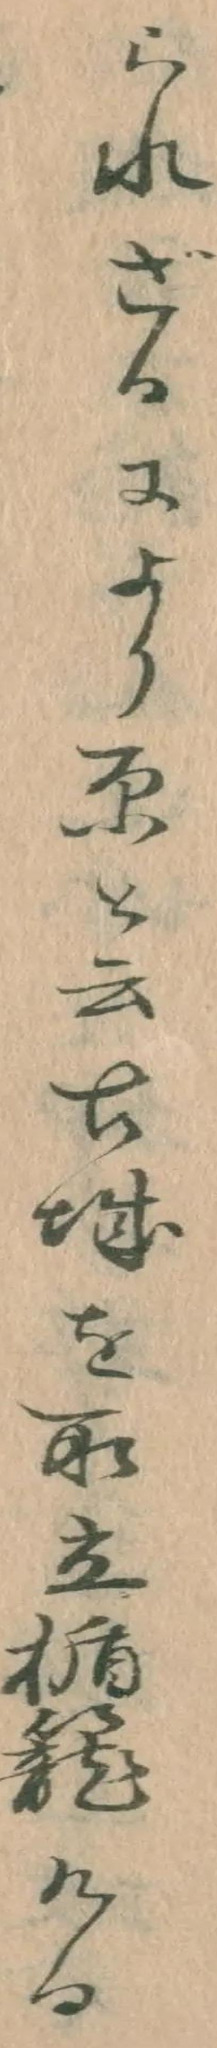られざるにより原と云古城を取立楯籠ける
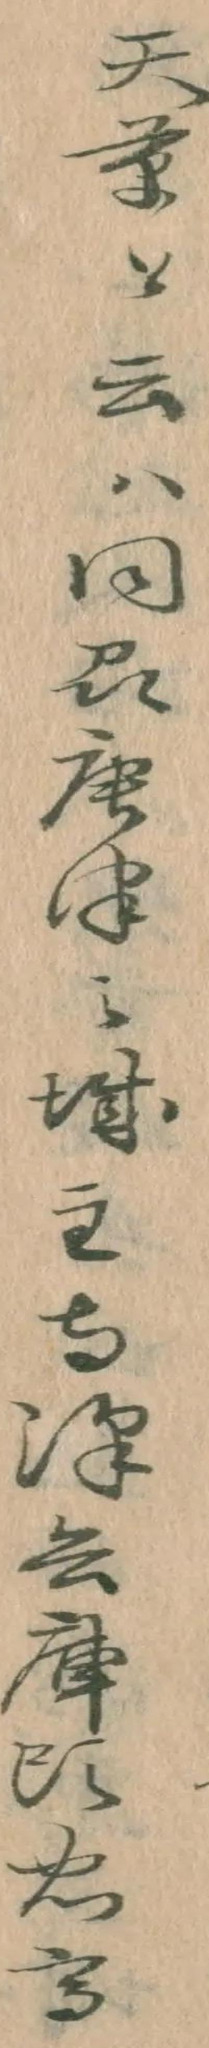天草と云は同州唐津之城主寺沢兵庫頭忠高
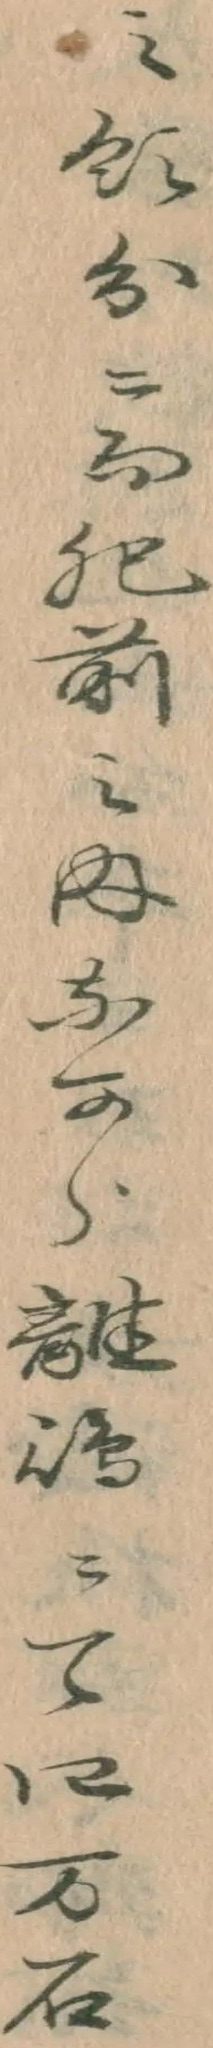之領分に而肥前之内なから離島にて四万石
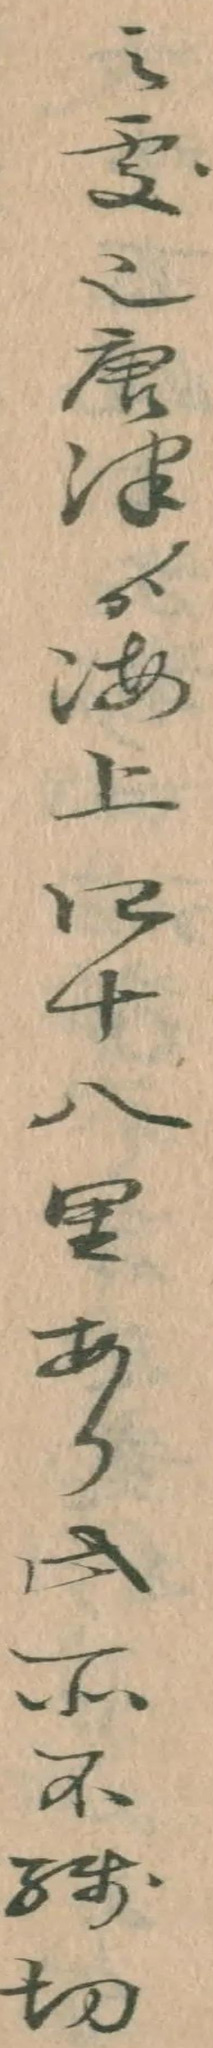之処也唐津ゟ海上四十八里あり此所不残切
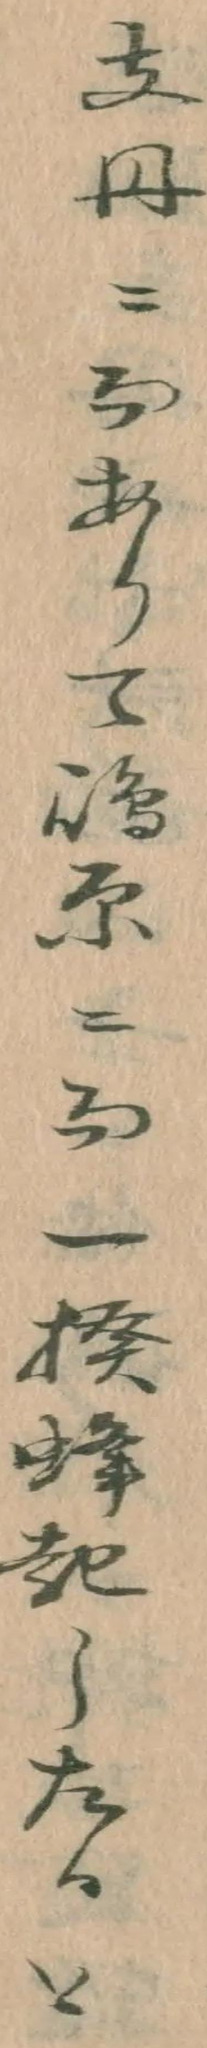支丹に而ありて島原に而一揆蜂起したると
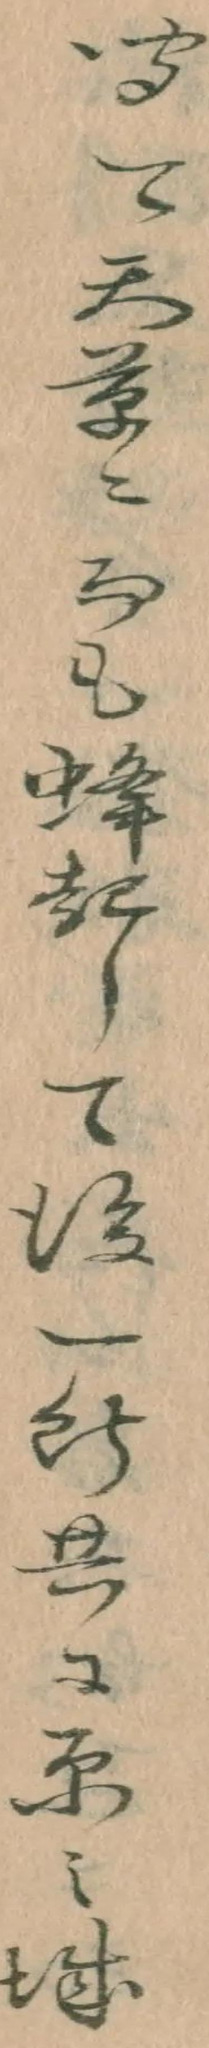聞て天草に而も蜂起して後一所共に原之城
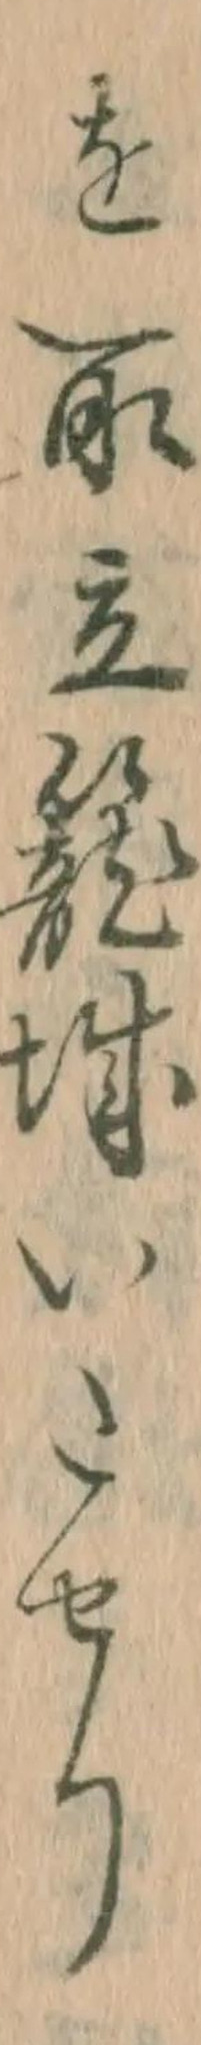を取立籠城いたせり
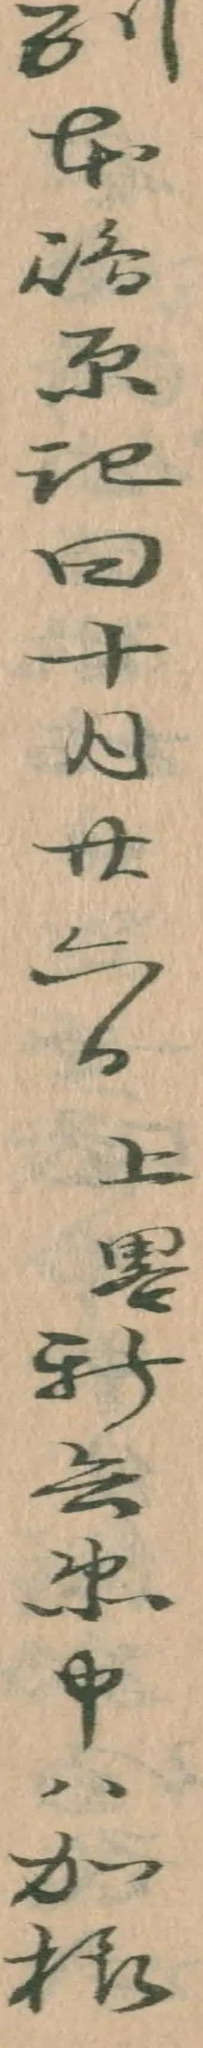別本島原記日十月廿六日上略新兵衛申は加様
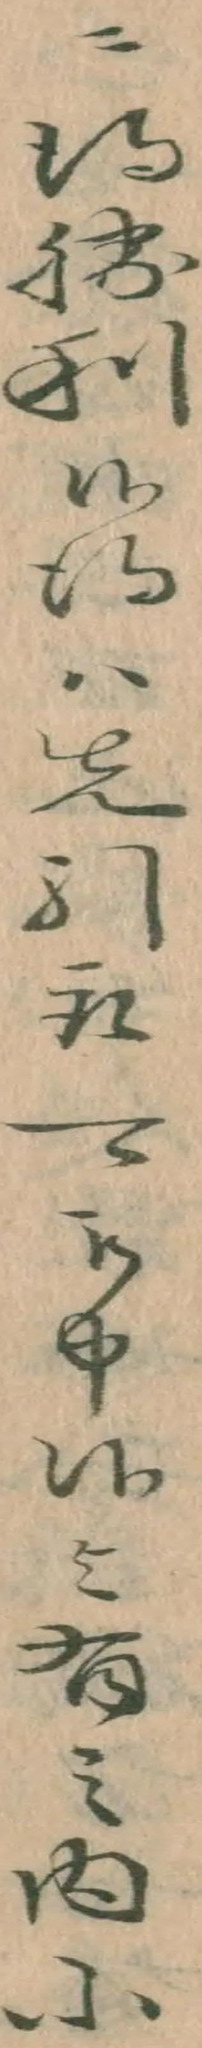に得勝利候得は先引取可被申候与有之内小
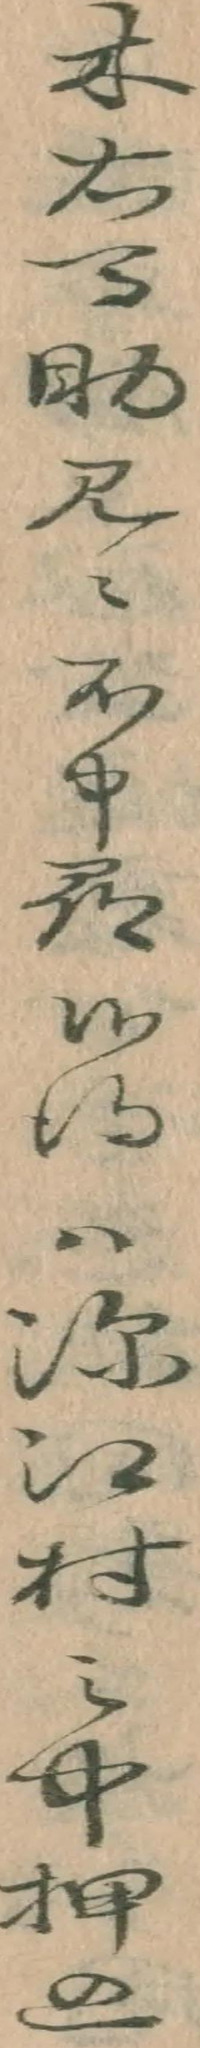木右馬助見に不申尋候得は深江村之中押込
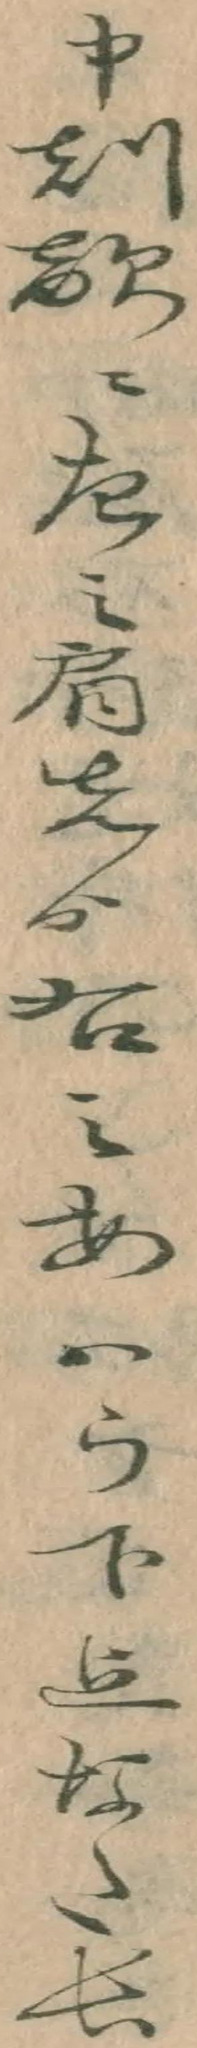申刻敵に左之肩先ゟ右之あはら下迄なた長
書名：切支丹御退治記 49巻. [1]
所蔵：国立国会図書館 National Diet Library, JAPAN
